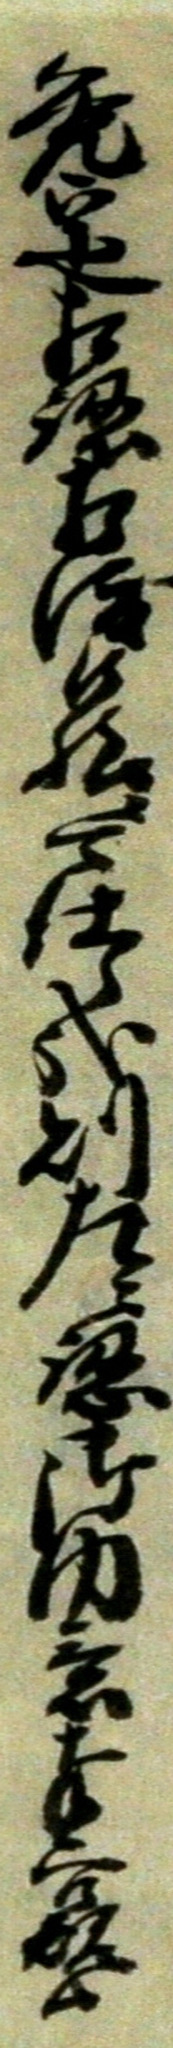免定相認相渡候様ニ可仕候哉則左ニ認御内意奉窺候
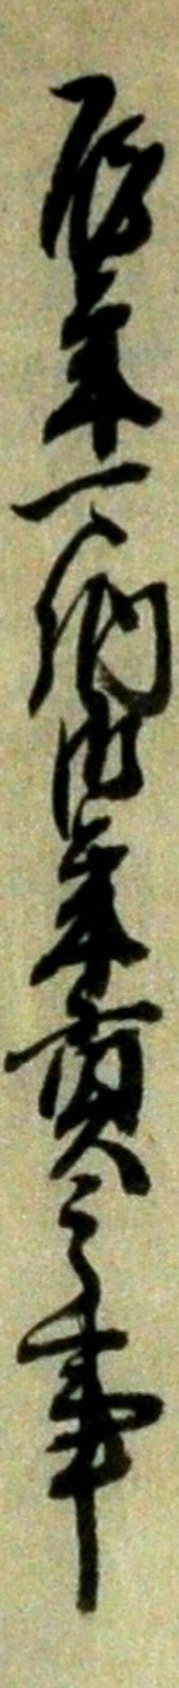辰年可納御年貢之事
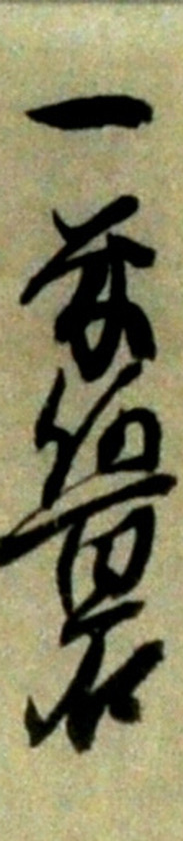一米何百石
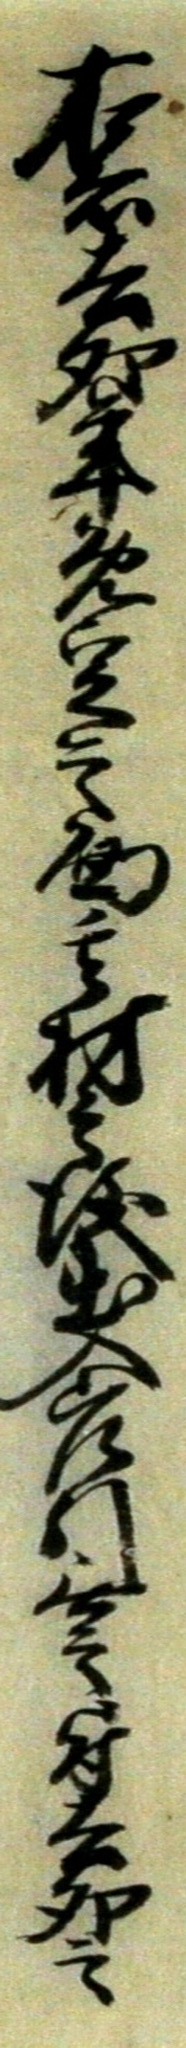右者去卯年免定之面其村之儀出入差引無之ニ付去卯之
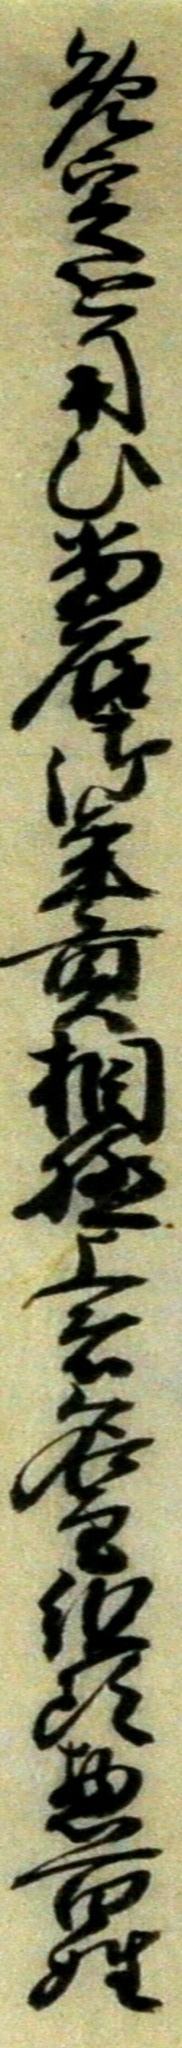免定を用ひ当辰御年貢相極上者名主組頭惣百姓
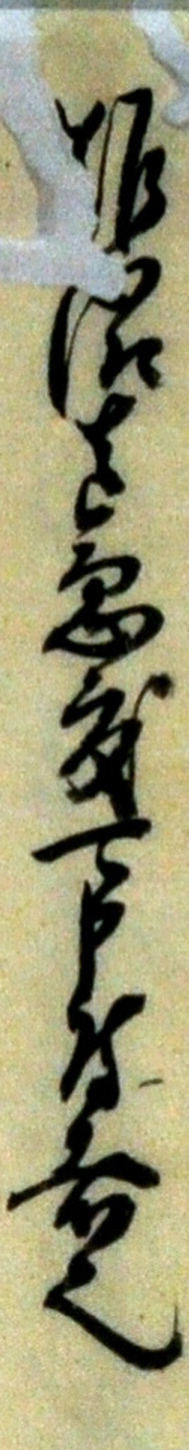難渋者急度可申付者也
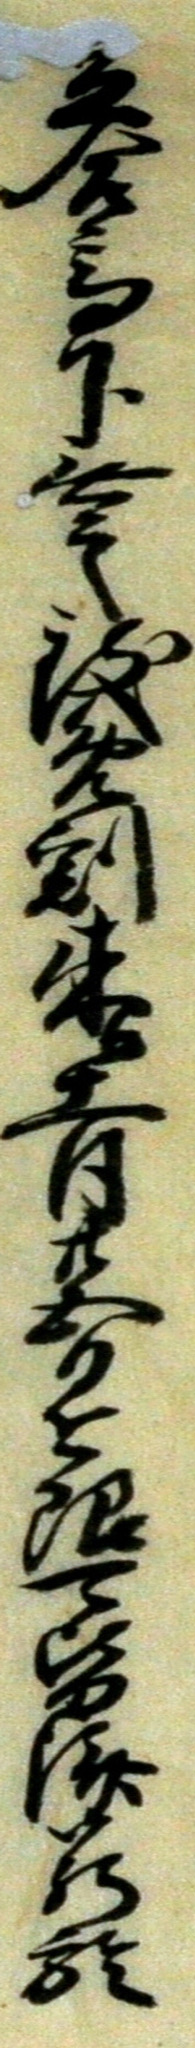立合高下無之致免割来ル十一月廿五日を限可皆済若於
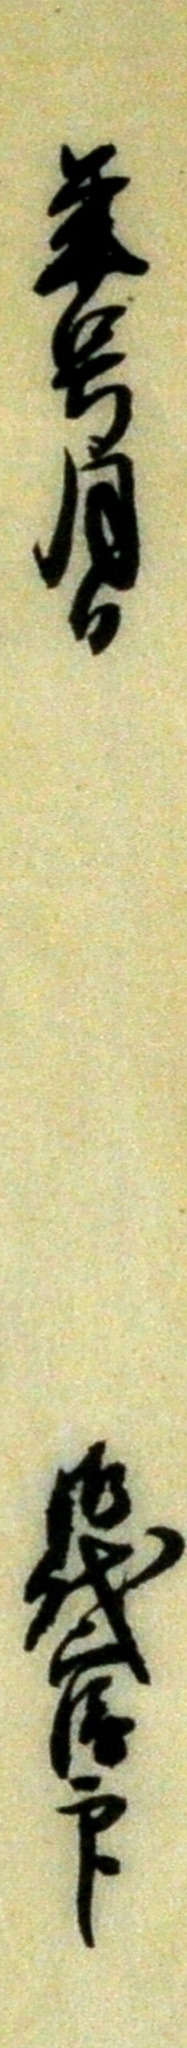年号月日御代官印
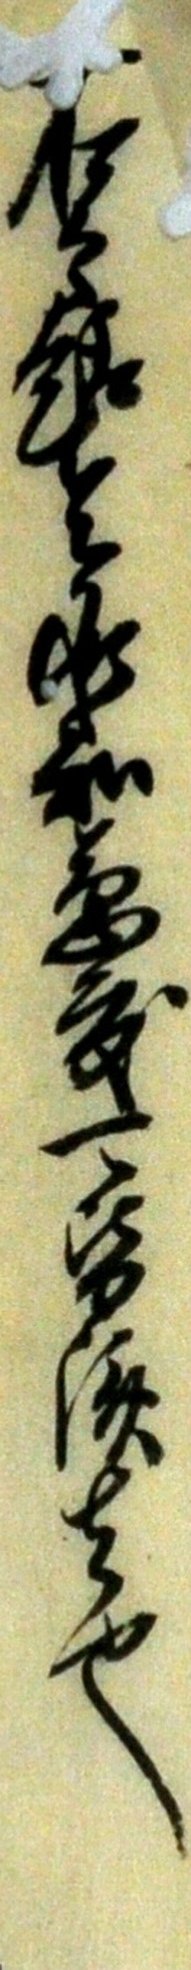右之趣令承知急度可皆済者也
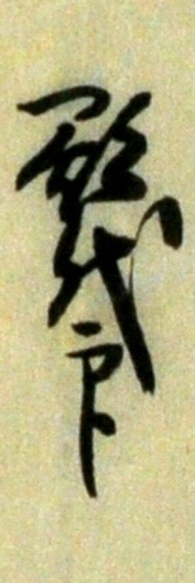郡代印
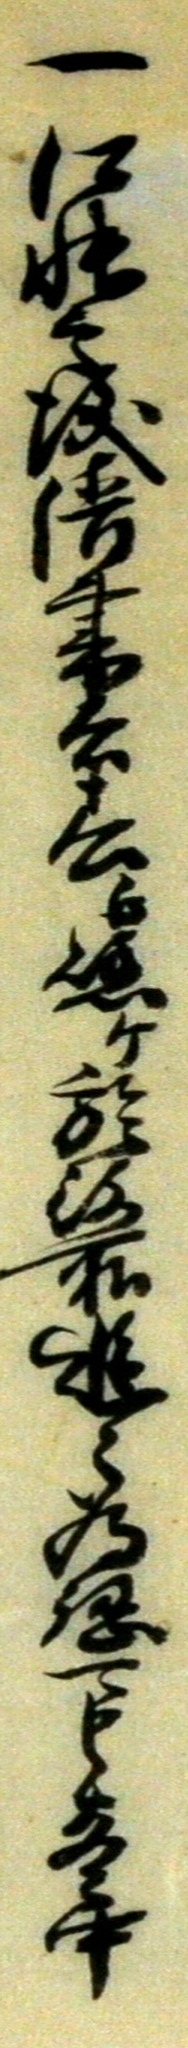一郷帳之儀請書者春江懸ケ於役所追々為認可申候冬中
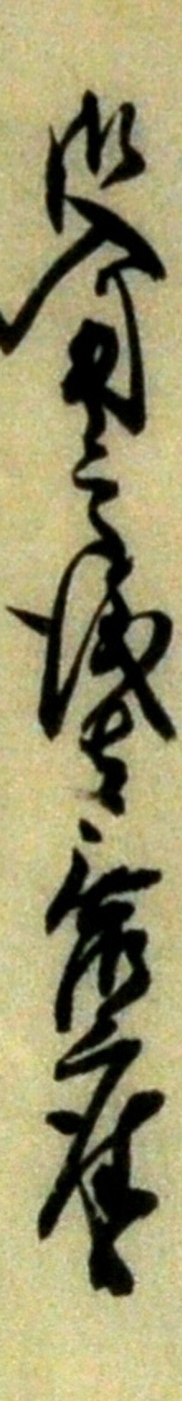御入用之儀者無御座候
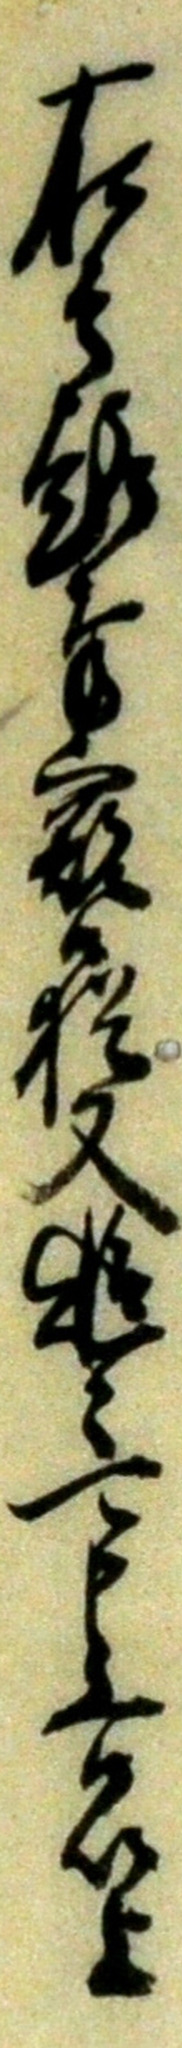右之趣奉窺候猶又追々可申上候以上
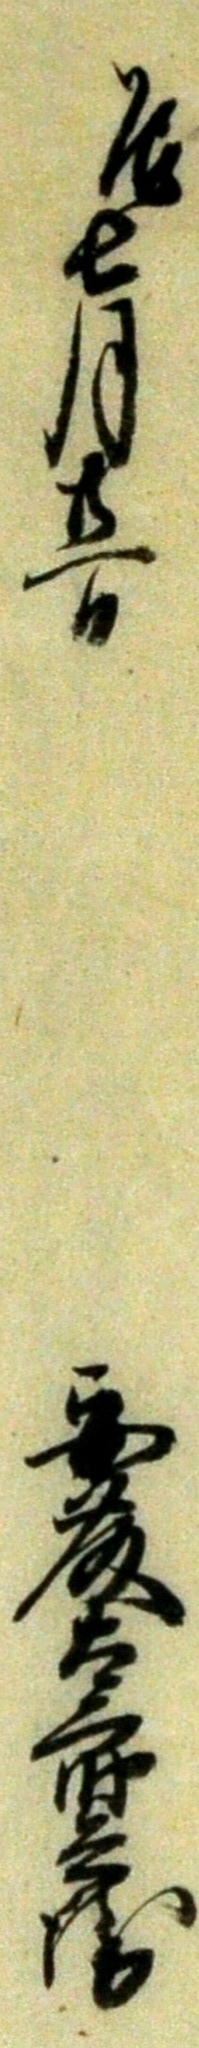辰七月廿一日安藤太郎兵衛
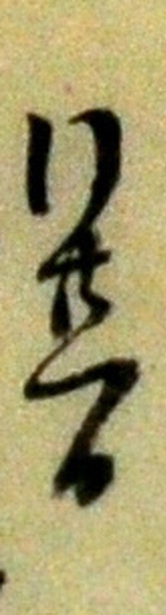同廿一日
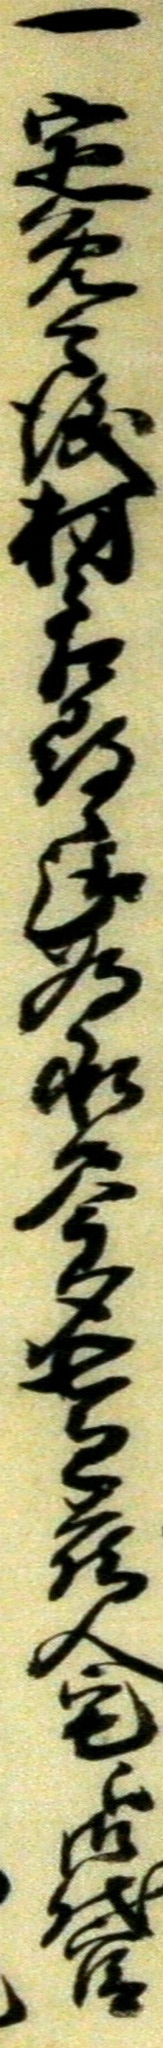一定免之儀村々相尋候趣為承候今夕蔵人宅江御代官
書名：留書
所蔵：伊那市立高遠町図書館・合同会社AMANE
